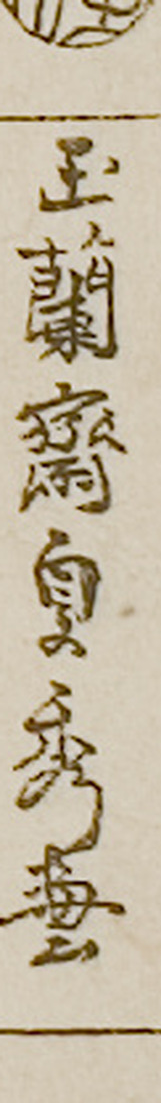玉蘭斎貞秀画
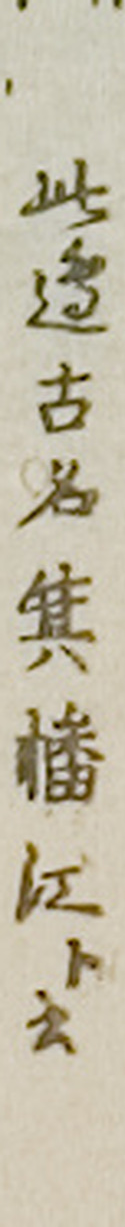此辺古名箕幡江ト云
